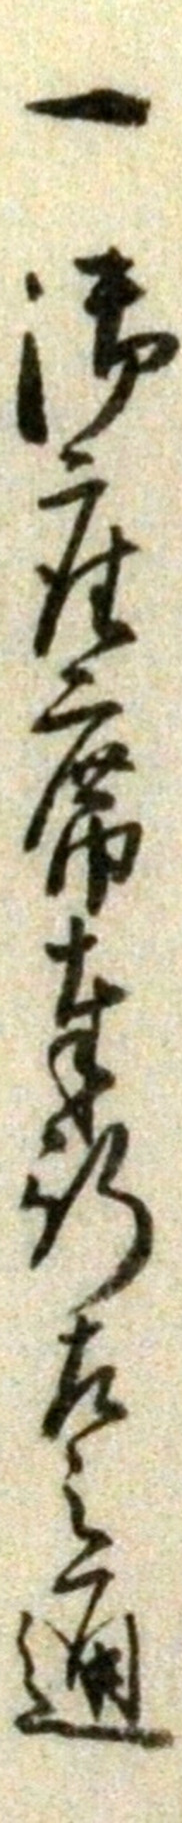一御座席奉行左之通
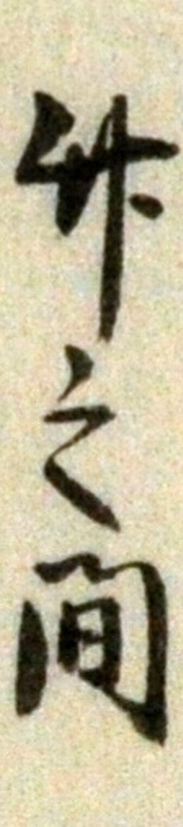竹之間
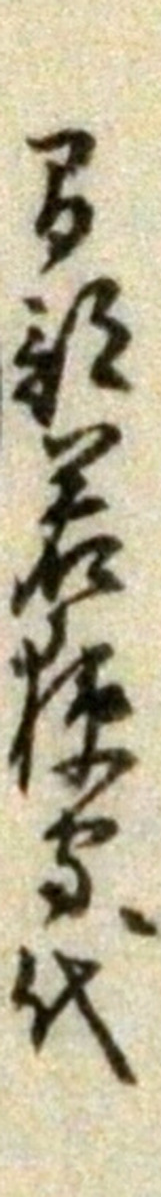間部若狭守代
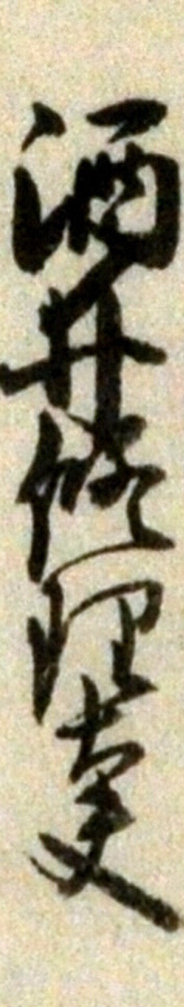酒井修理大夫
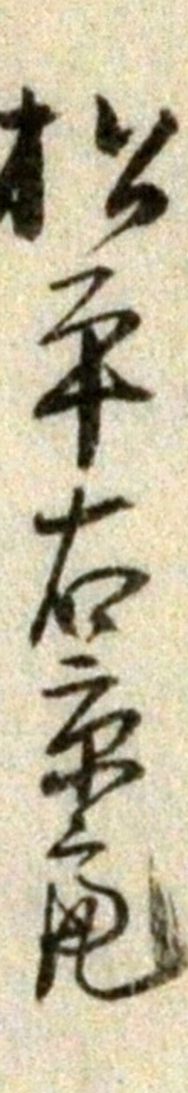松平右京亮
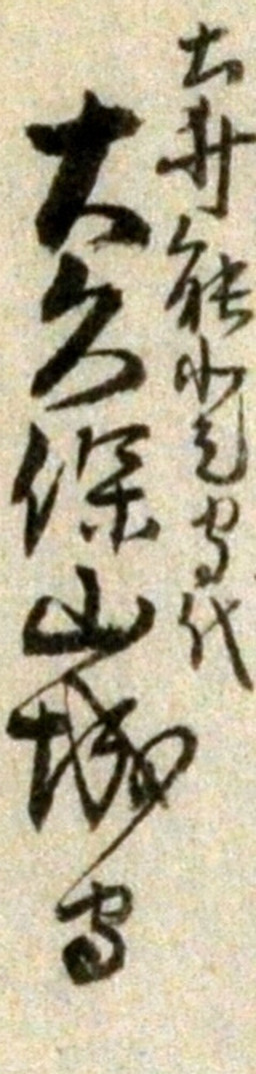大久保山城守
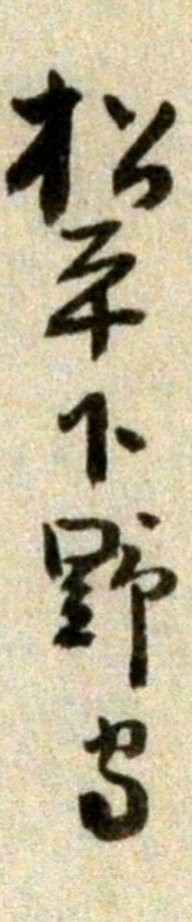松平下野守
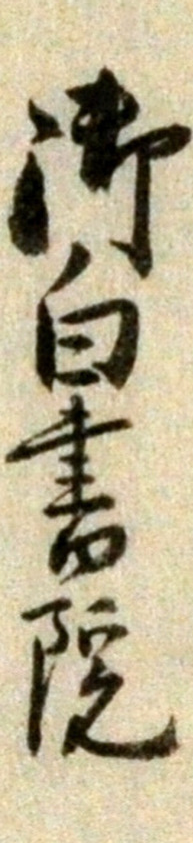御白書院
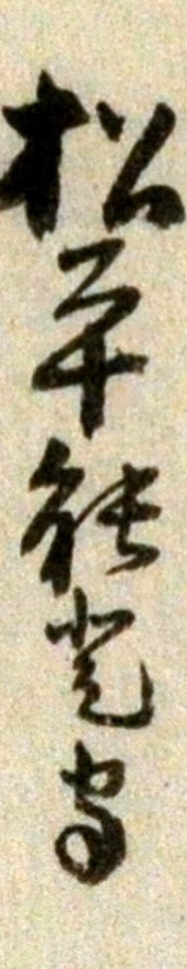松平能登守
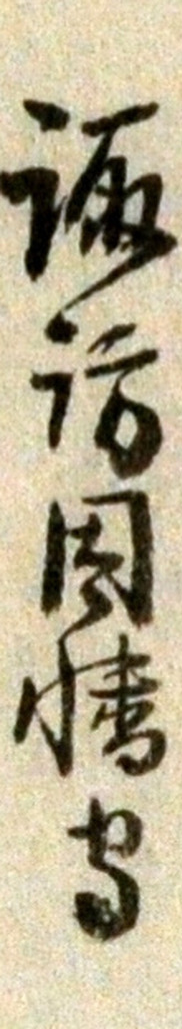諏訪因幡守
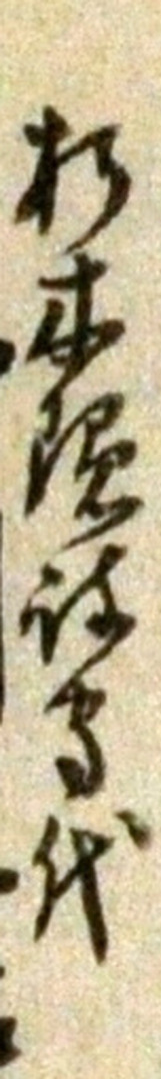朽木隠岐守代
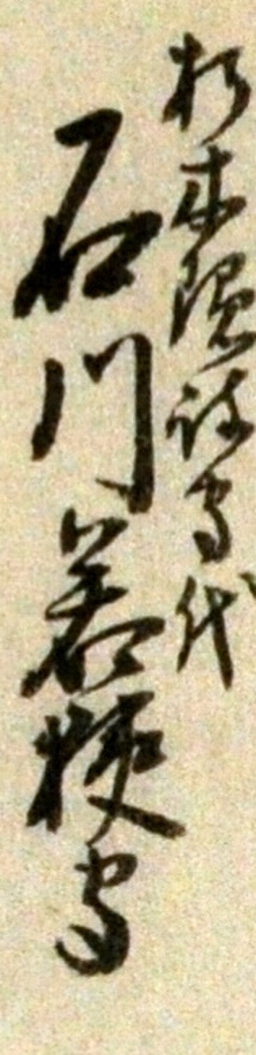石川若狭守
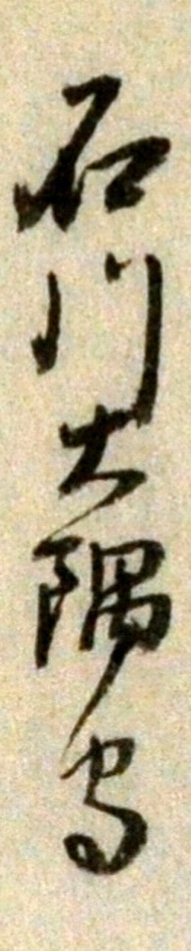石川大隅守
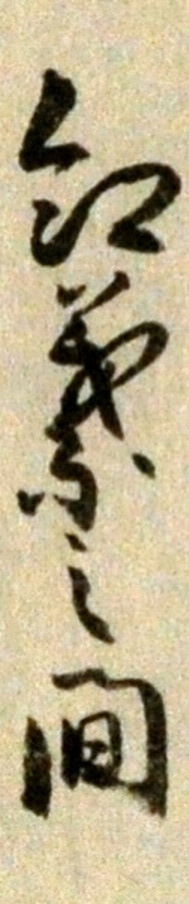紅葉之間
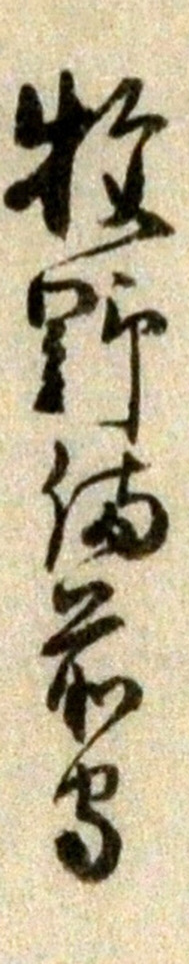牧野備前守
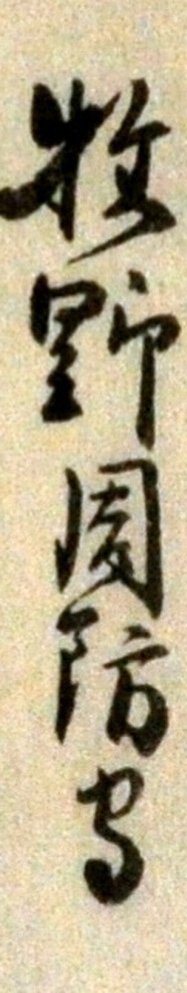牧野周防守
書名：若君様（家斉嫡男）誕生諸祝儀ノ節ノ留書外
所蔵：伊那市立高遠町図書館・合同会社AMANE
